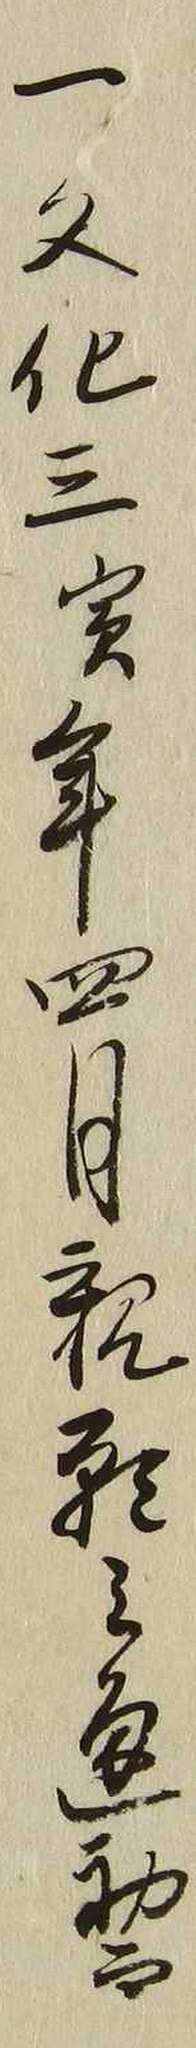一文化三寅年四月親願之通初而
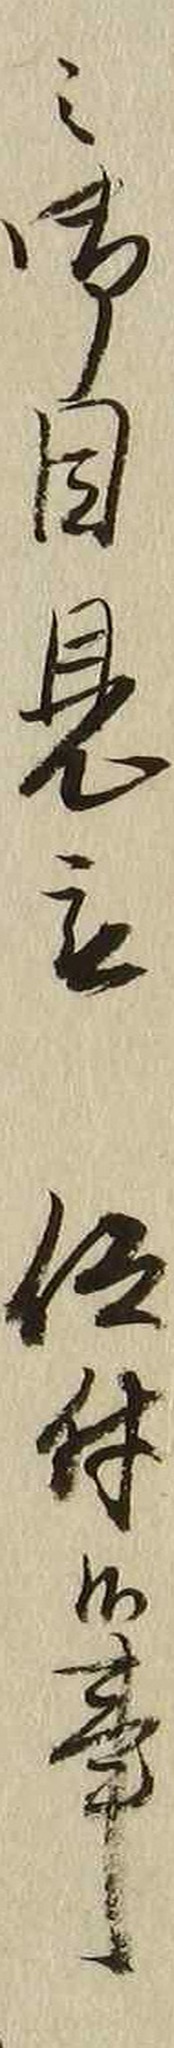之御目見被仰付候事
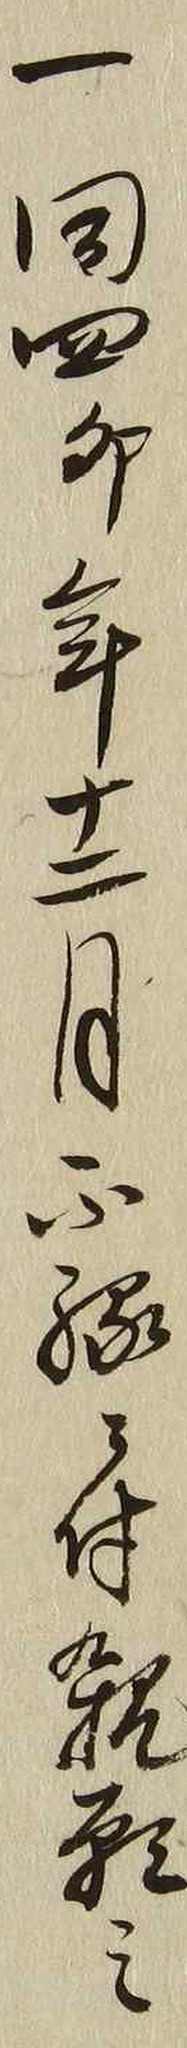一同四卯年十二月不縁ニ付親願之
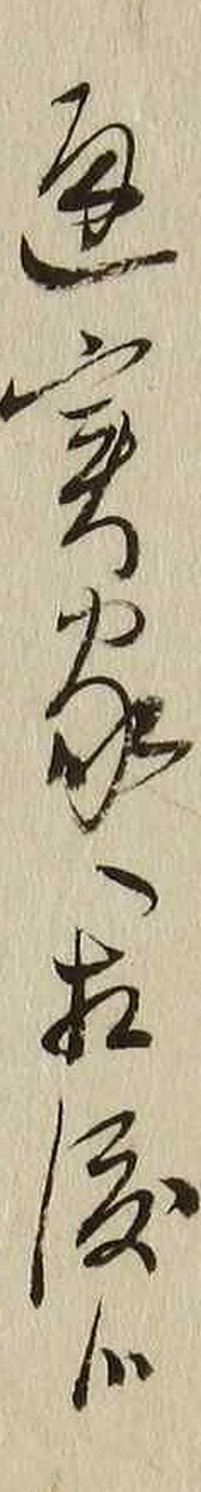通実家へ相渡候
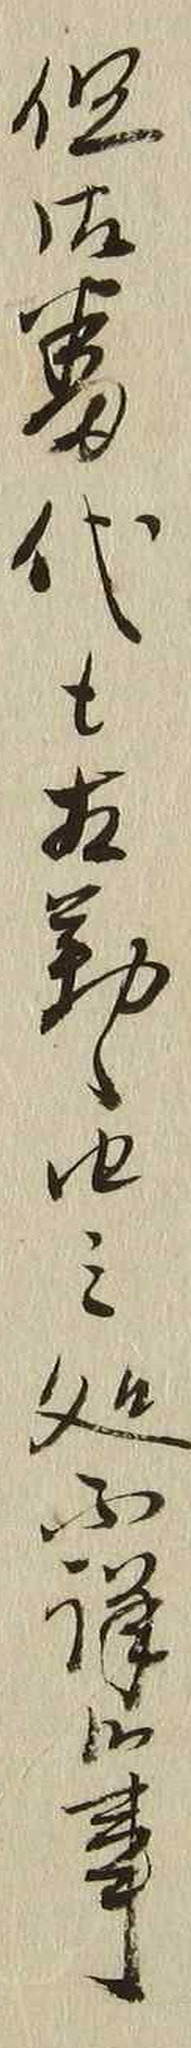但御番代も相勤候由之処不詳候事
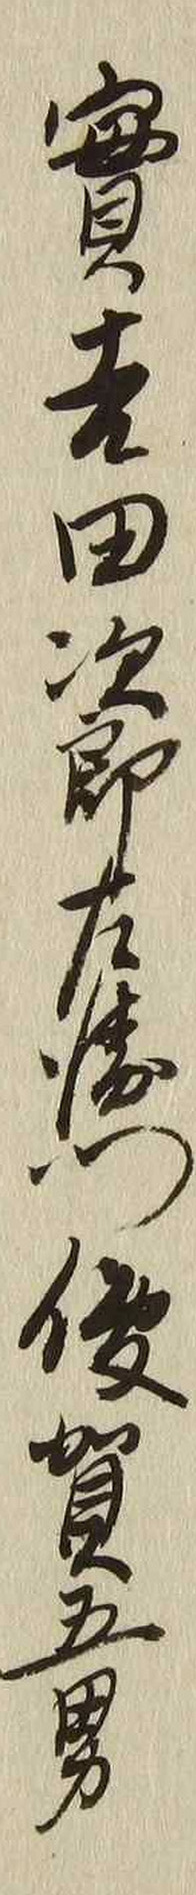実吉田次郎左衛門俊賀五男
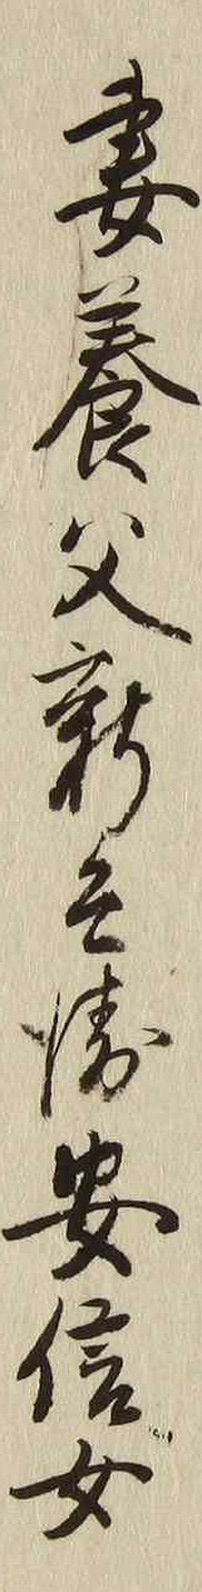妻養父新兵衛安信女
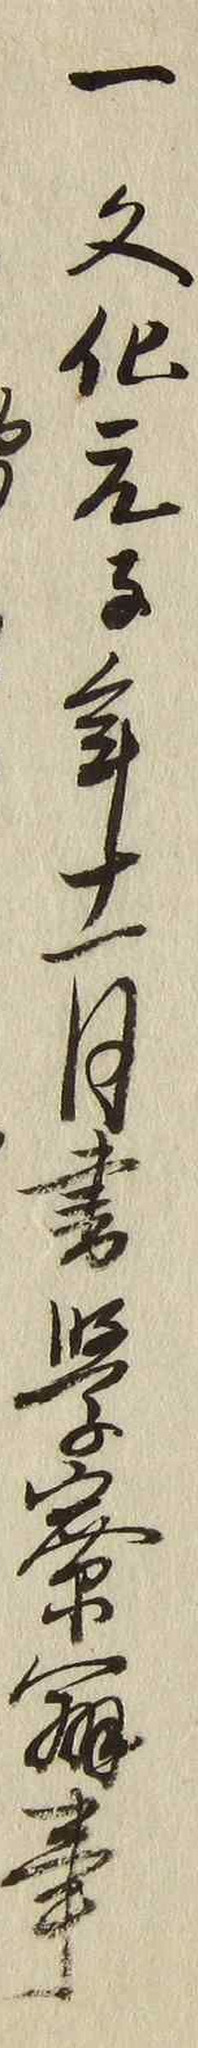一文化元子年十一月書学寮弁事
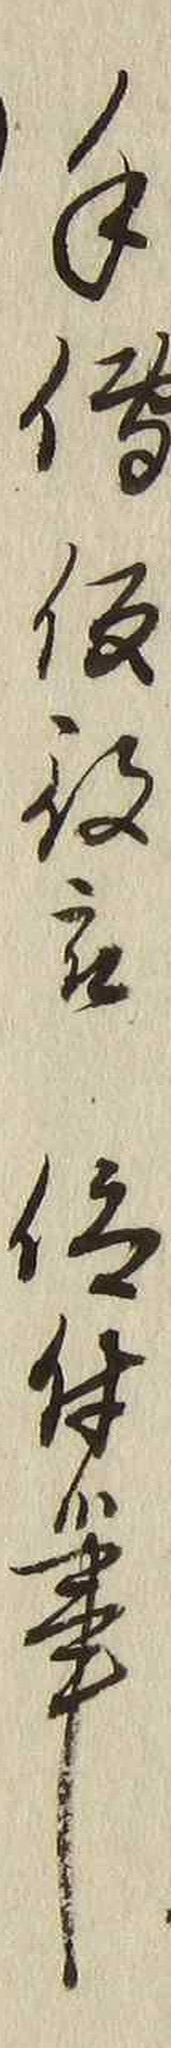手伝仮役被仰付候事
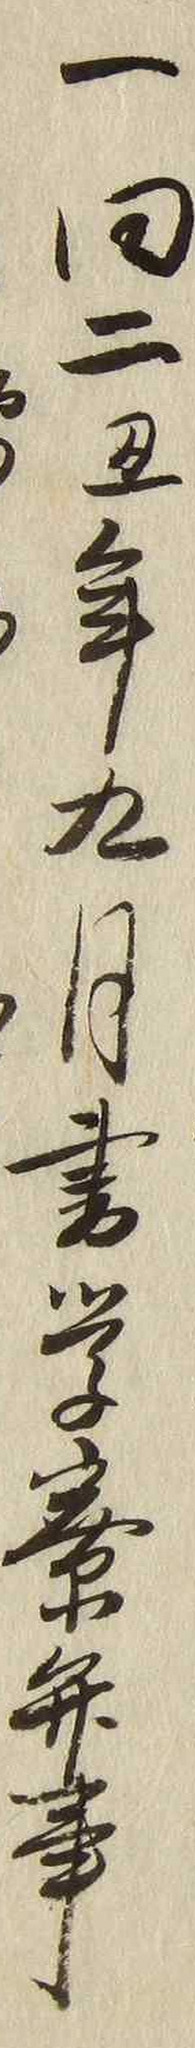一同二丑年九月書学寮弁事
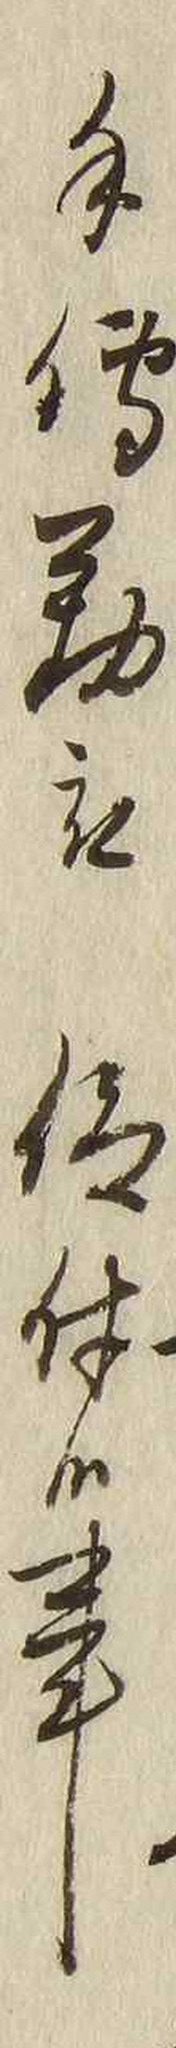手伝勤被仰付候事

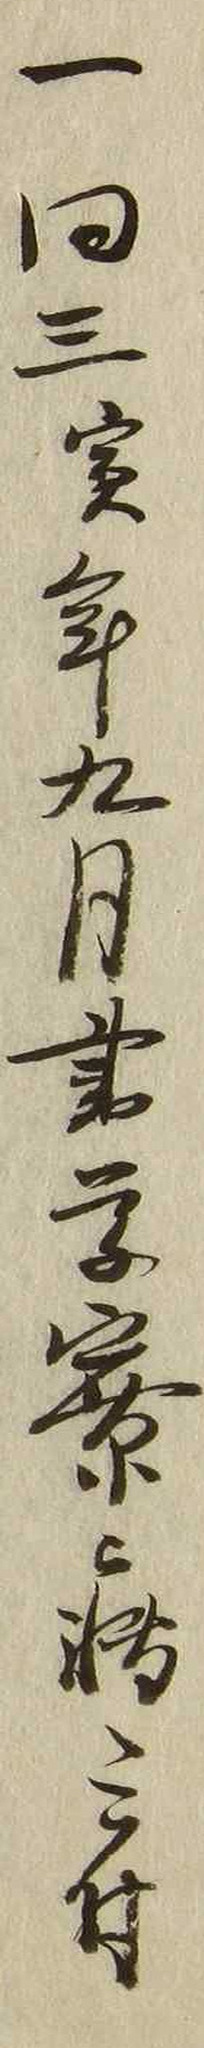一同三寅年九月書学寮被転候ニ付
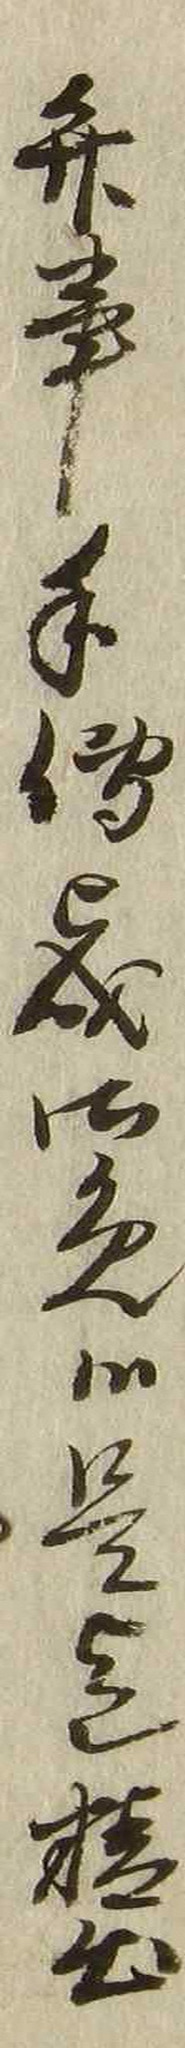弁事手伝被成御免候是迄精出
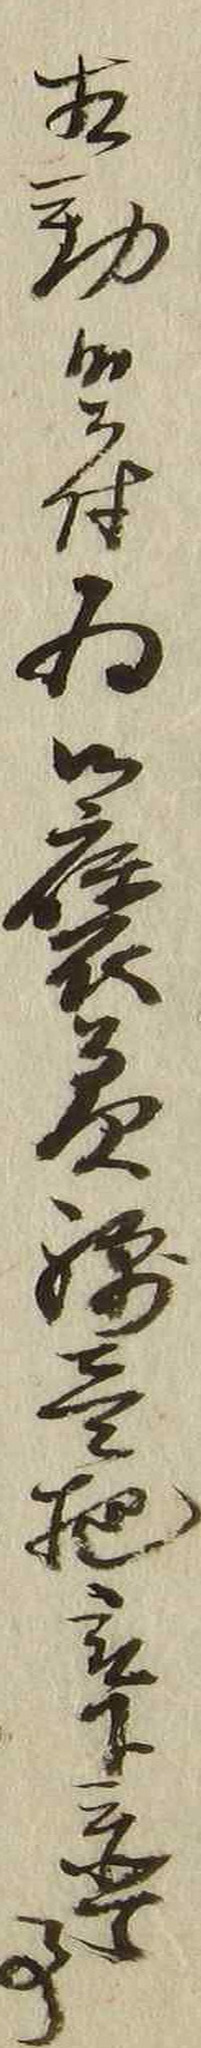相勤候ニ付為御褒美綿壱把被下置候事
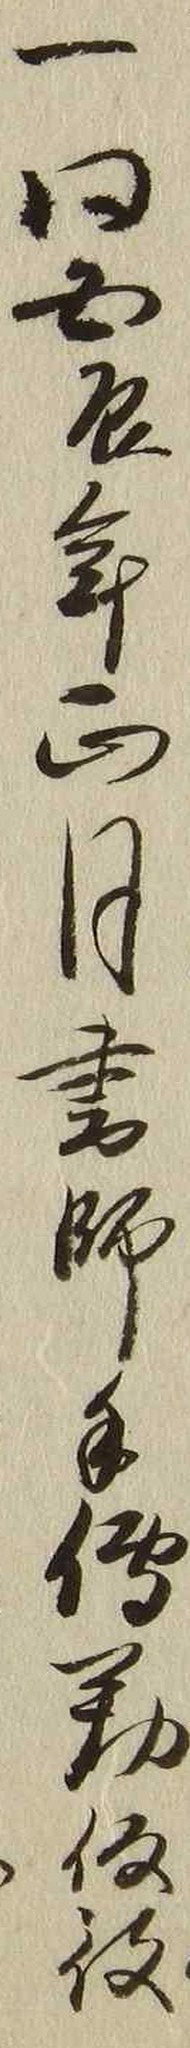一同五辰年正月書師手伝勤仮役
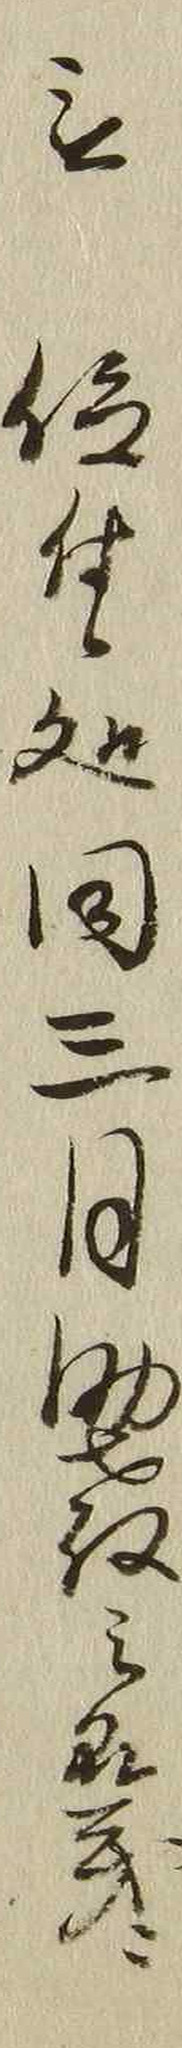被仰付候処同三月助教之名義ニ
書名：諸士系譜　巻之348　も之部4
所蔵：会津若松市立会津図書館
